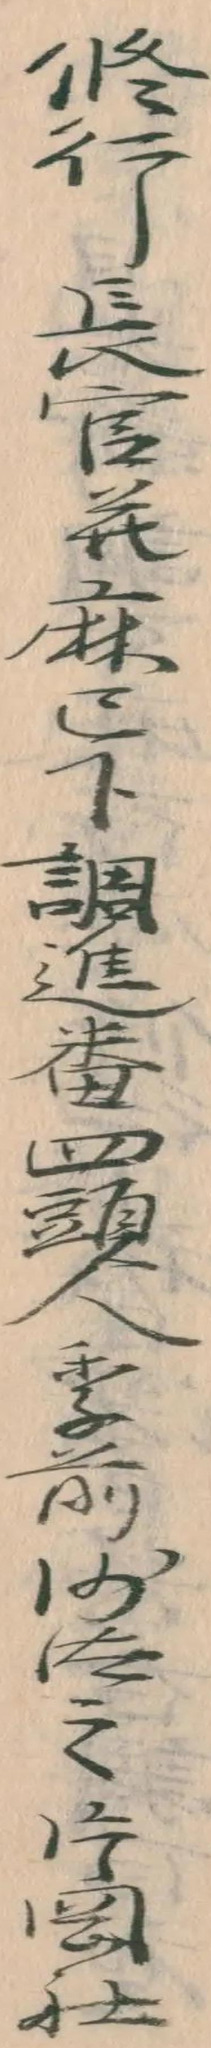修行長官并麻已下調進番四頭人季前沙汰之片岡社
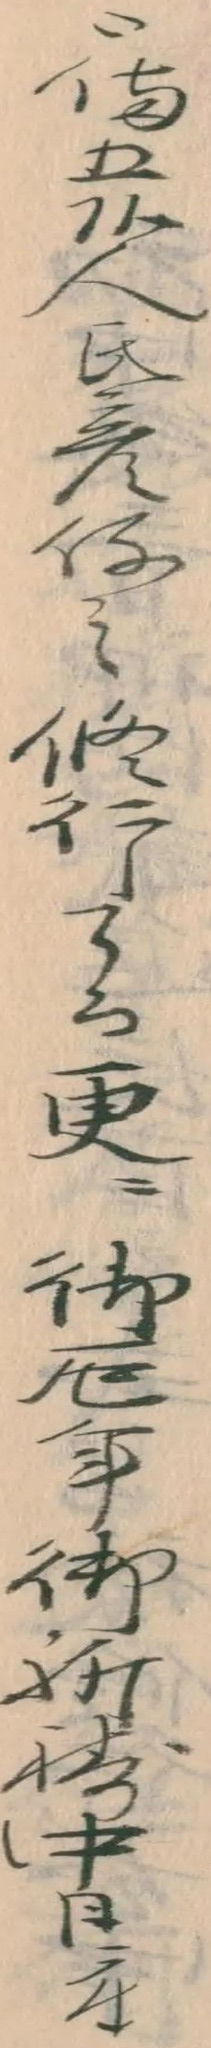御備五頭人氏彦役之修行了而更ニ御厄年御祈祷中日ニ付
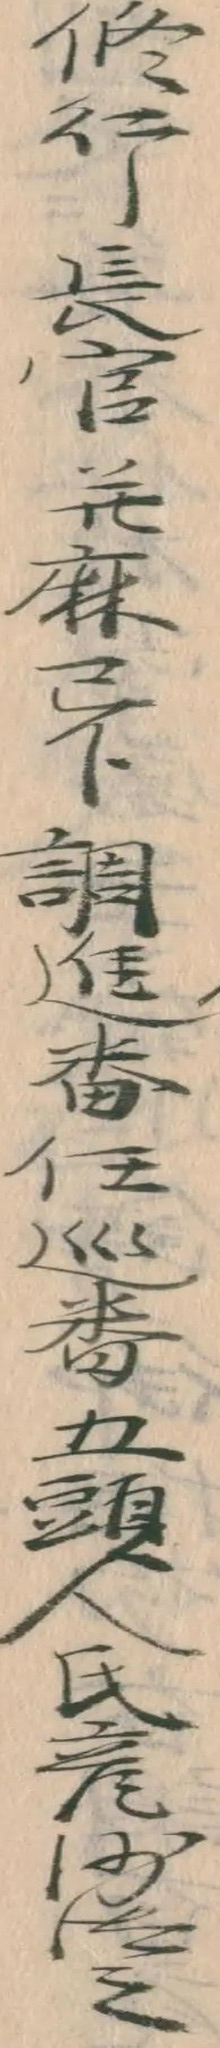修行長官并麻已下調進番任巡番五頭人氏彦沙汰之
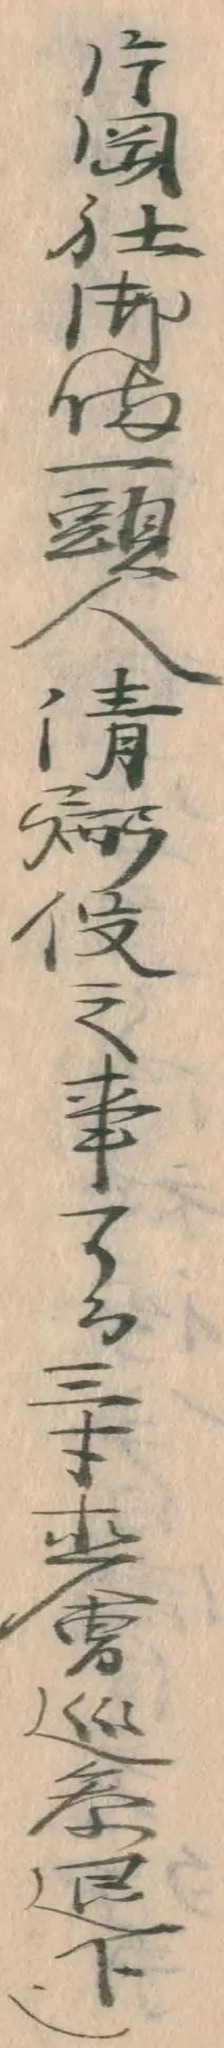片岡社御備一頭人清弼役之事了而三寸直會巡参退下也
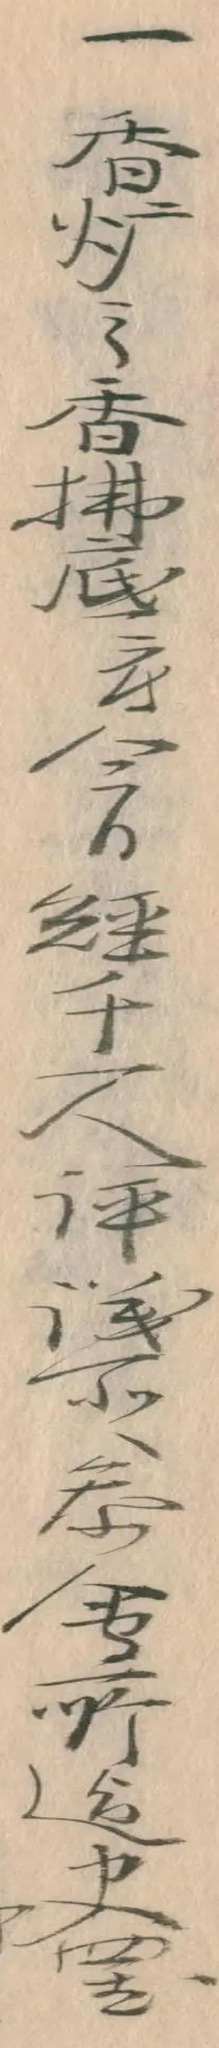一香炉之香払底ニ付今日経千一人評議所へ参會所迄申入置事
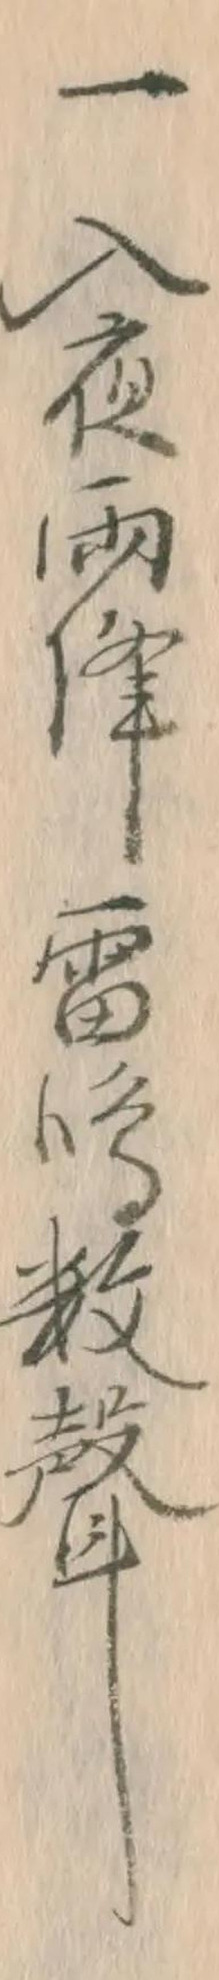一入夜雨降雷鳴数聲
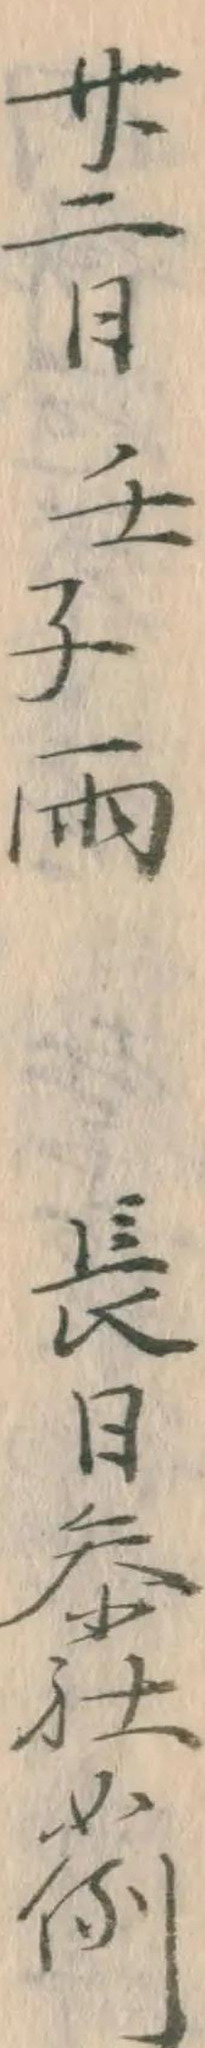廿二日壬子雨長日参社如例
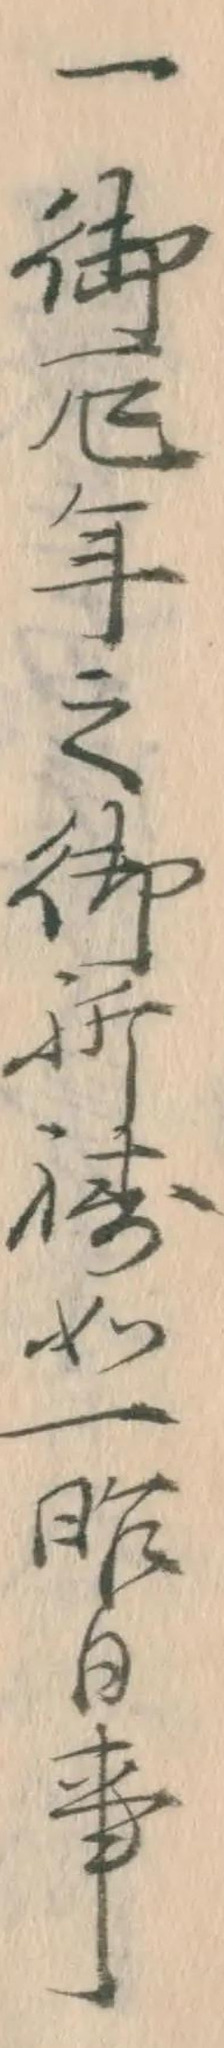一御厄年之御祈祷如一昨日事
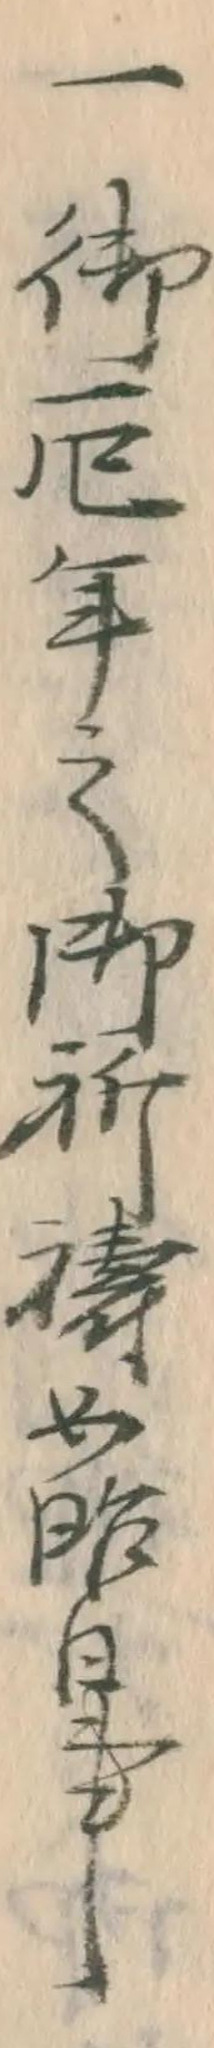一御厄年之御祈祷如昨日事
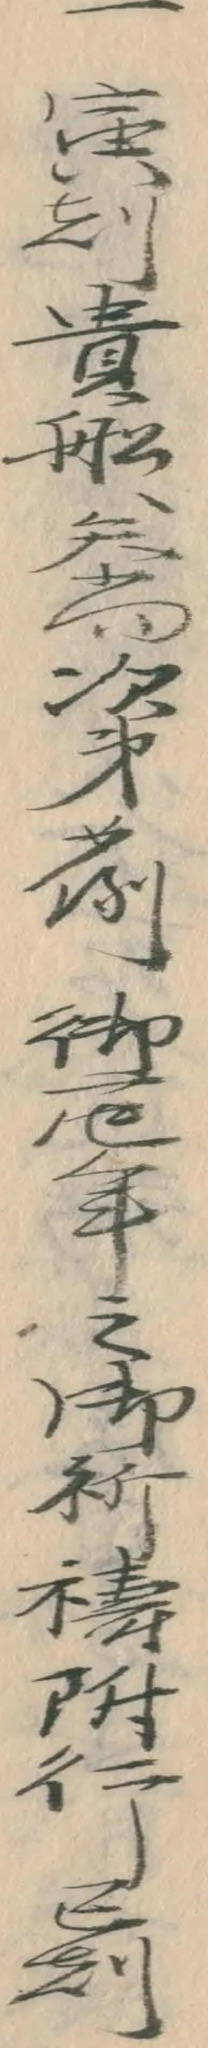一寅刻貴舩へ参詣次第如例御厄年之御祈祷附行巳刻

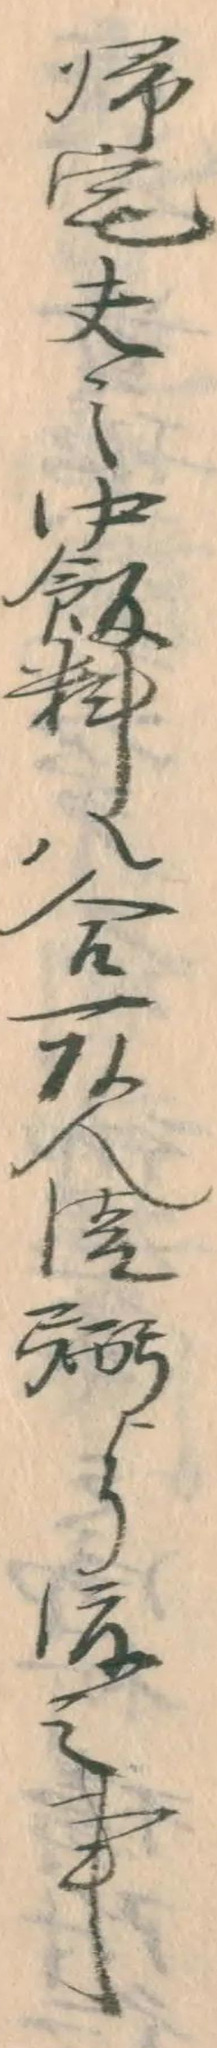帰宅夫之中飯料八合一頭人清弼より渡之事
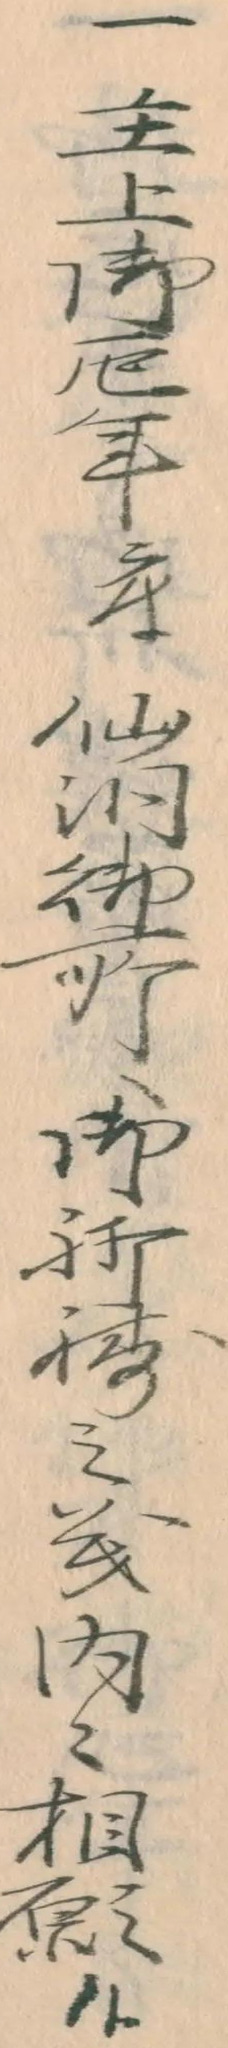一主上御厄年ニ付仙洞御所へ御祈祷之義内々相願候
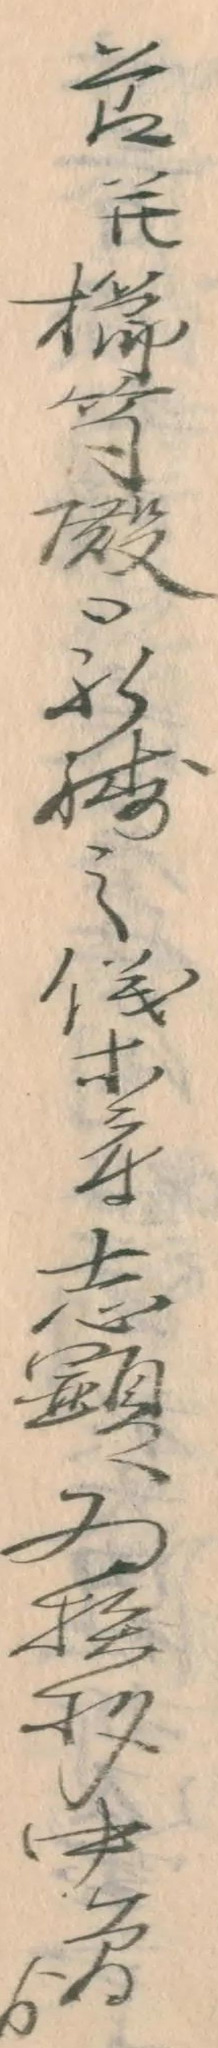節并櫛笥殿御祈祷之儀等ニ付志顕へ為挨拶中ケ間ゟ
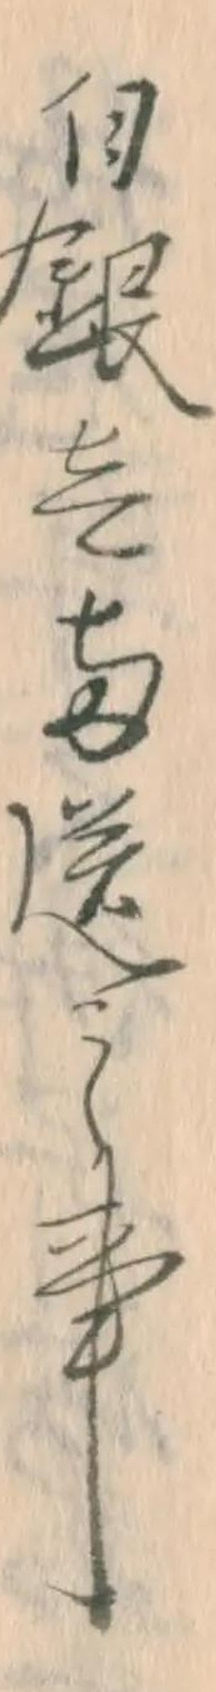白銀壱両送之事
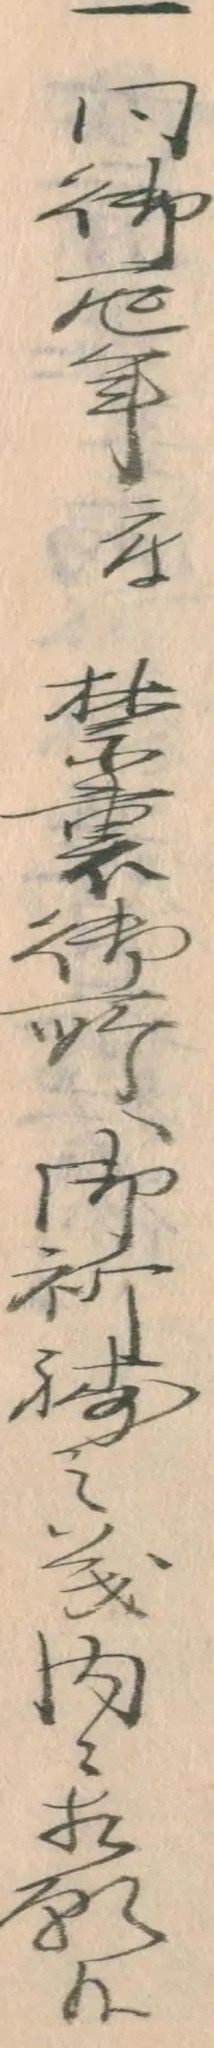一同御厄年ニ付禁裏御所へ御祈祷之義内々相願候
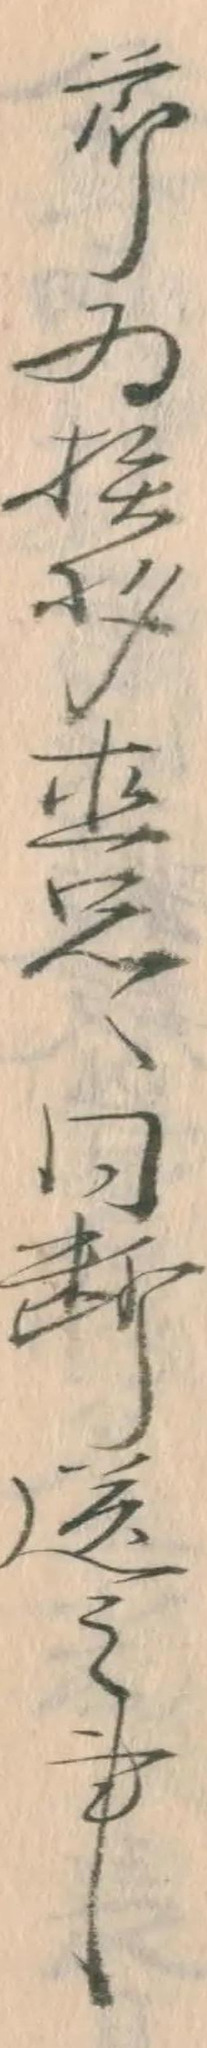節為挨拶直兄へ同断送之事
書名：賀茂社記録. 第73冊
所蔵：国立国会図書館 National Diet Library, JAPAN
